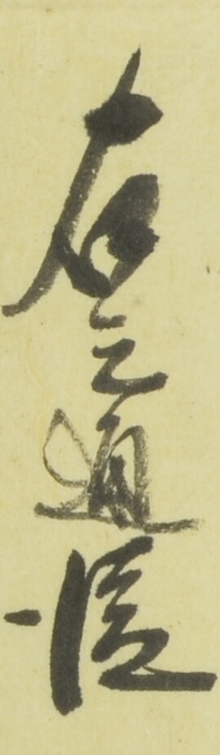右之通従
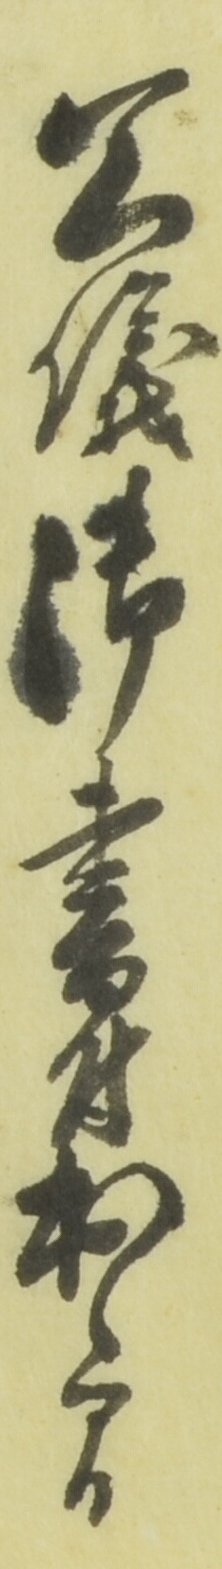公儀御書付出候間
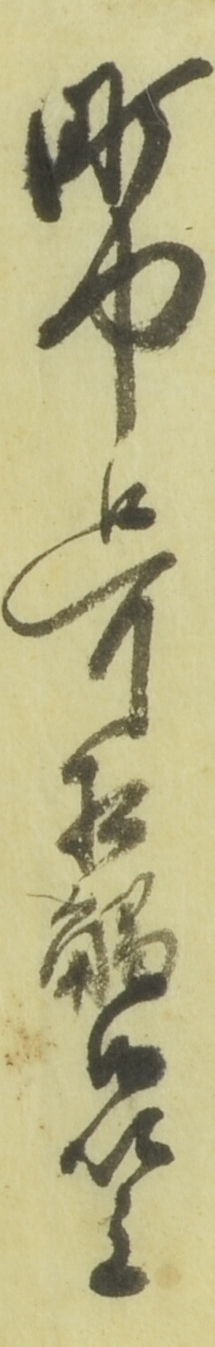町中江可相触候以上
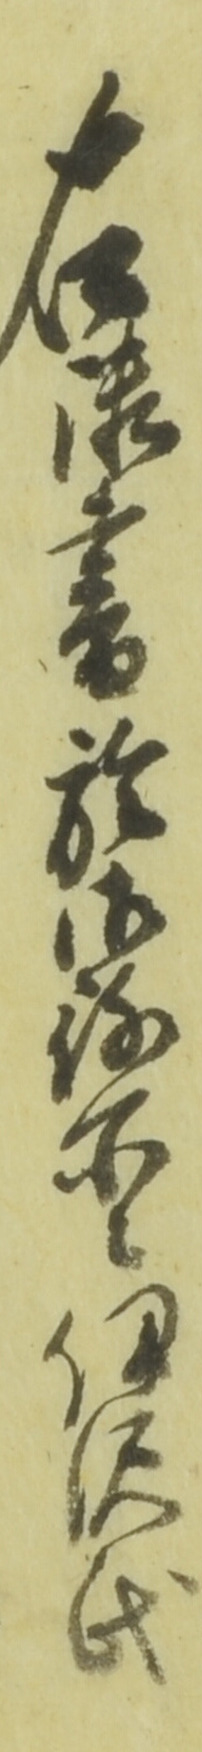右御書於御役所ニ伊沢氏
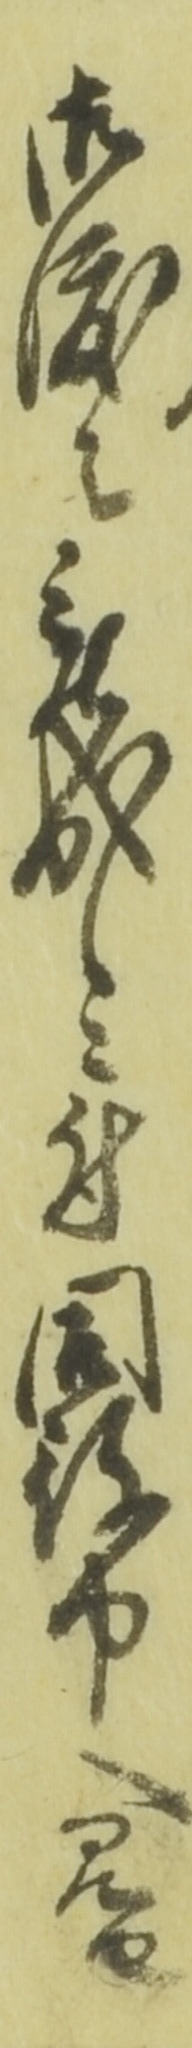御渡シ被成候ニ付同役中へ見セ
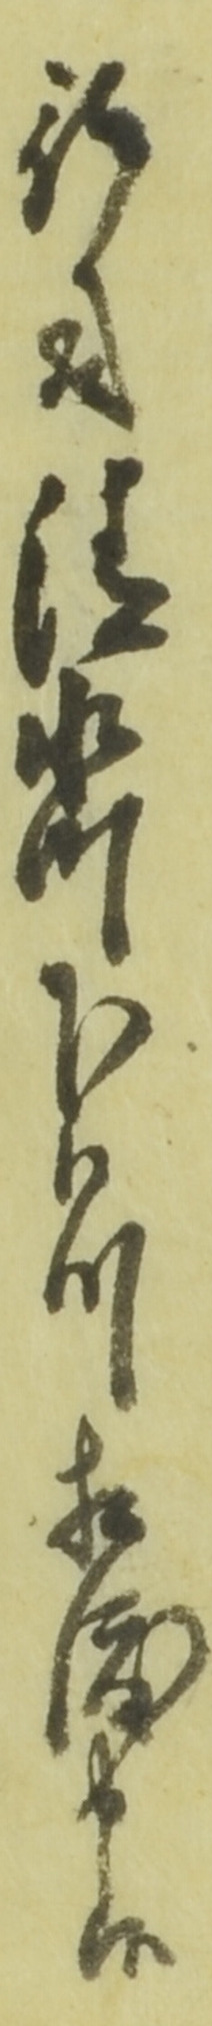所用清水町下も町相渡申候
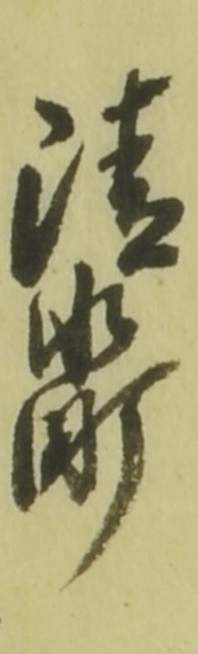清水町
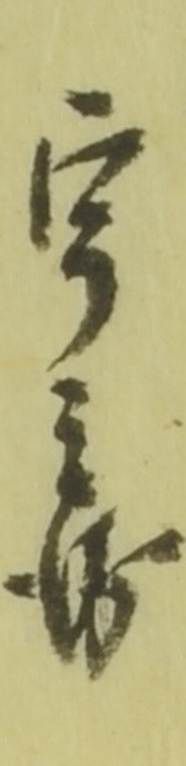宇兵衛
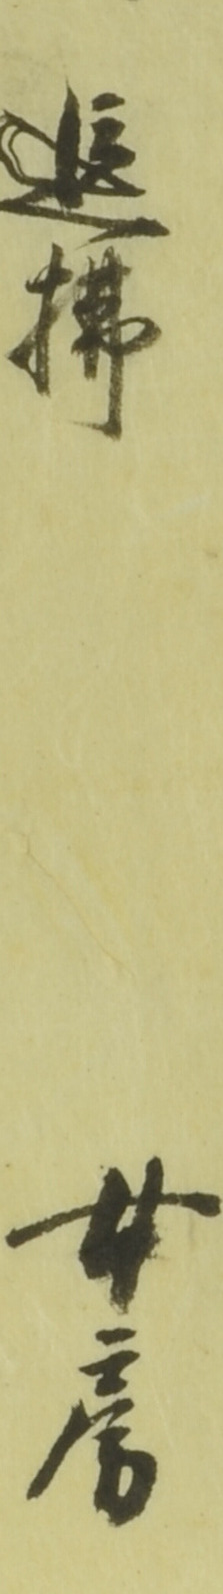追払女房
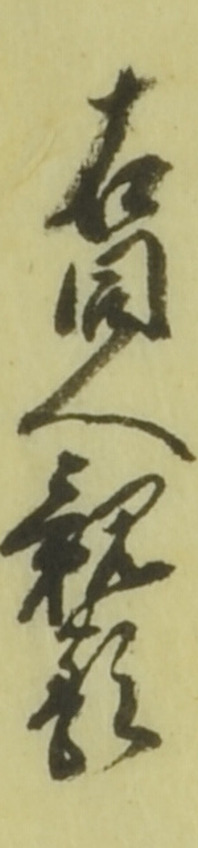右同人親類
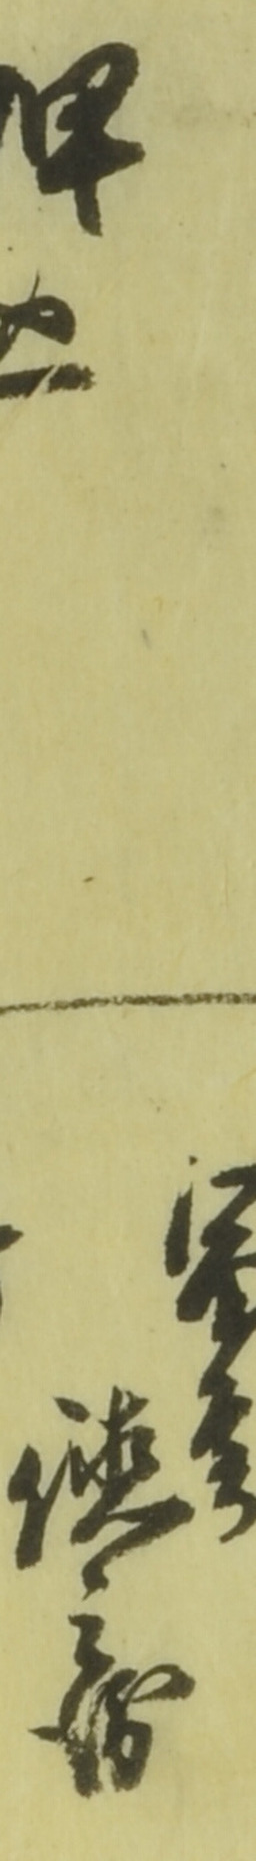宇兵衛
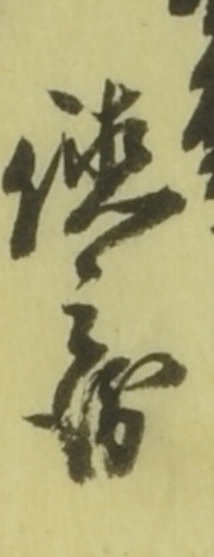宇兵衛

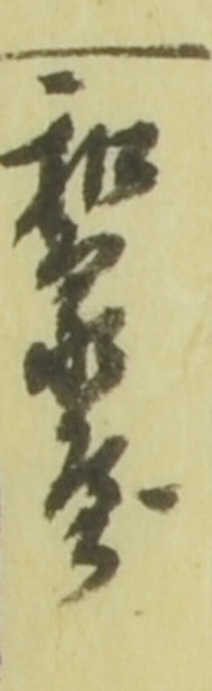和泉屋
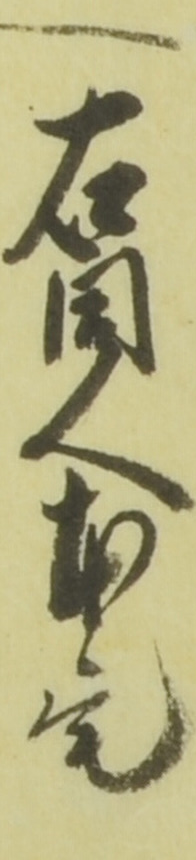右同人本宅
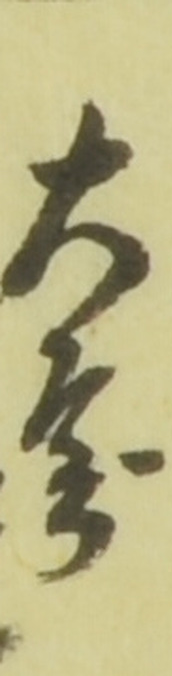茂兵衛
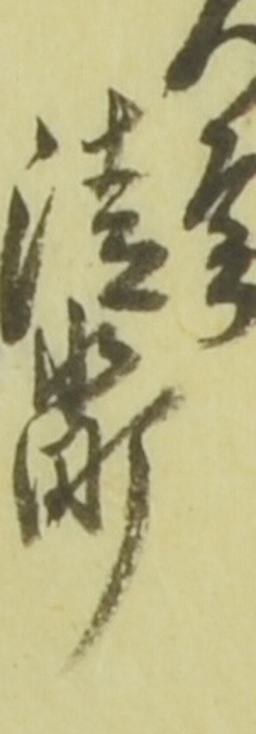清水町
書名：御触書御書附控
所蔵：伊那市立高遠町図書館・合同会社AMANE
